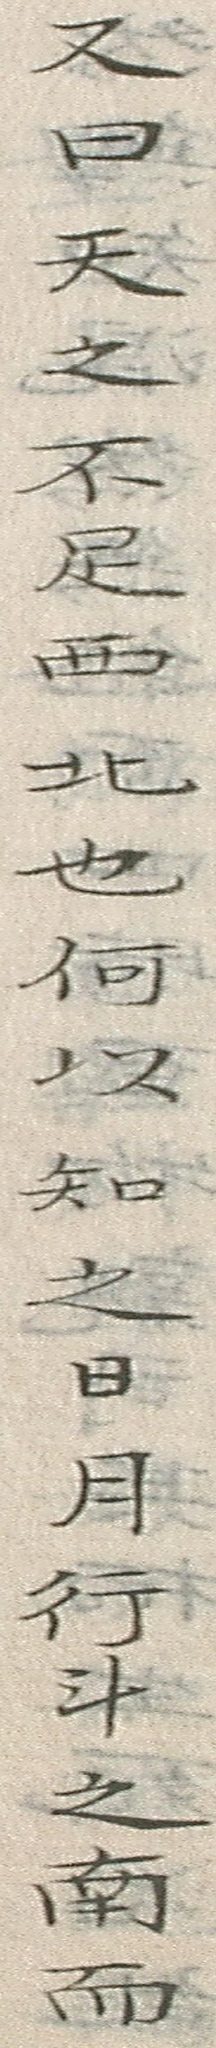又曰天之不足西北也何以知之日月行斗之南而
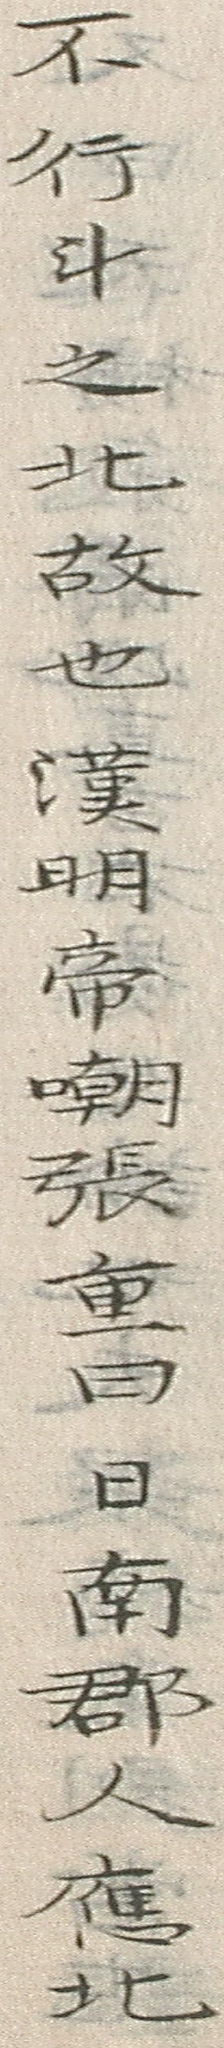不行斗之北故也漢明帝嘲張重曰日南郡人応北
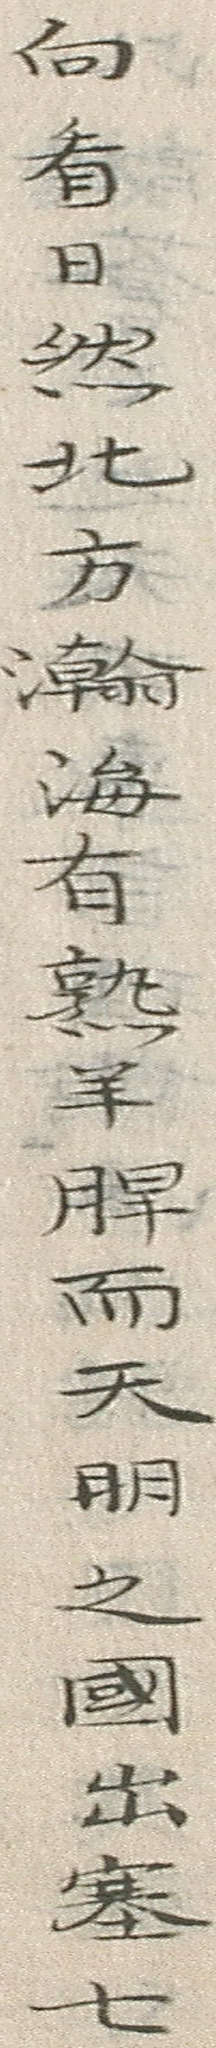向看日然北方瀚海有熟羊胛而天明之国出塞七
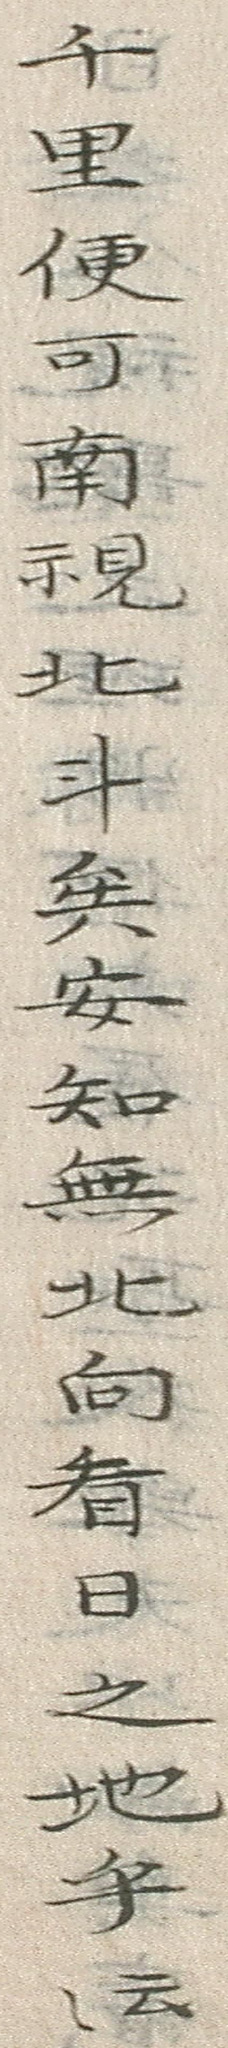千里便可南視北斗矣安知無北向看日之地乎云〻
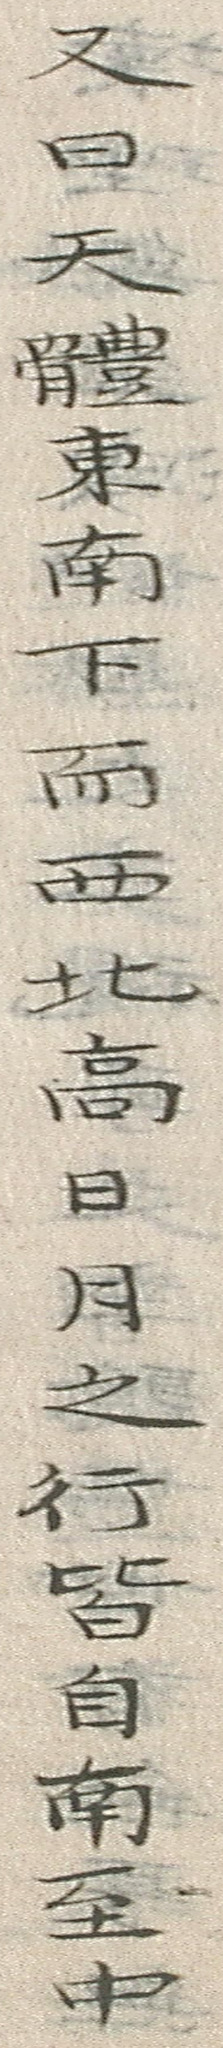又曰天体東南下而西北高日月之行皆自南至中
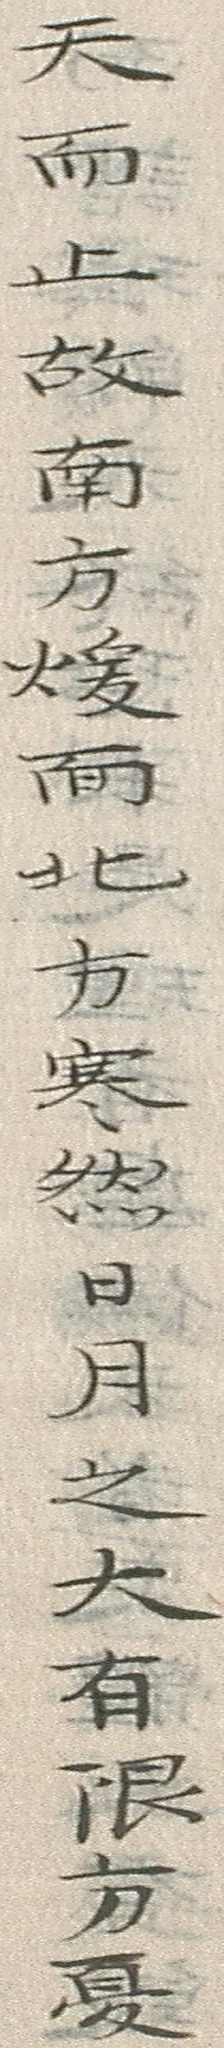天而止故南方煖而北方寒然日月之大有限方憂
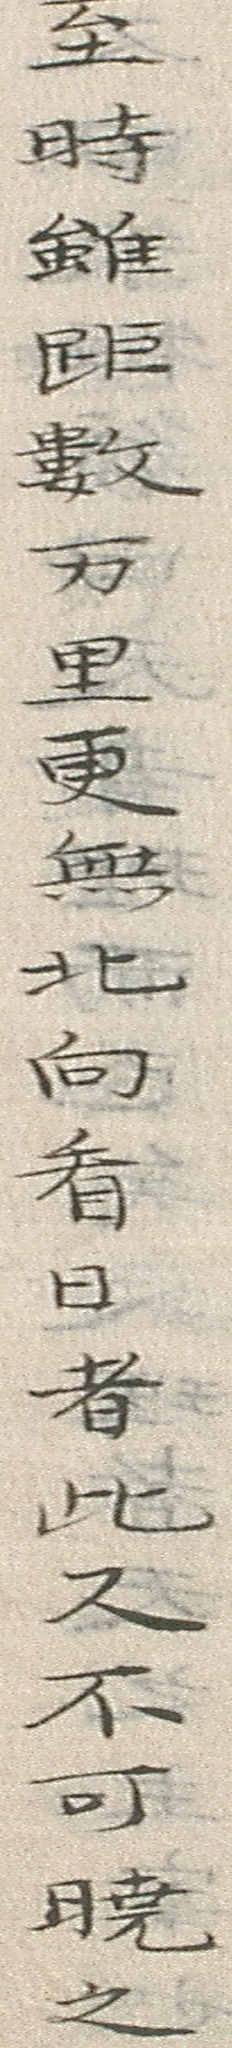至時雖距数万里更無北向看日者此又不可暁之
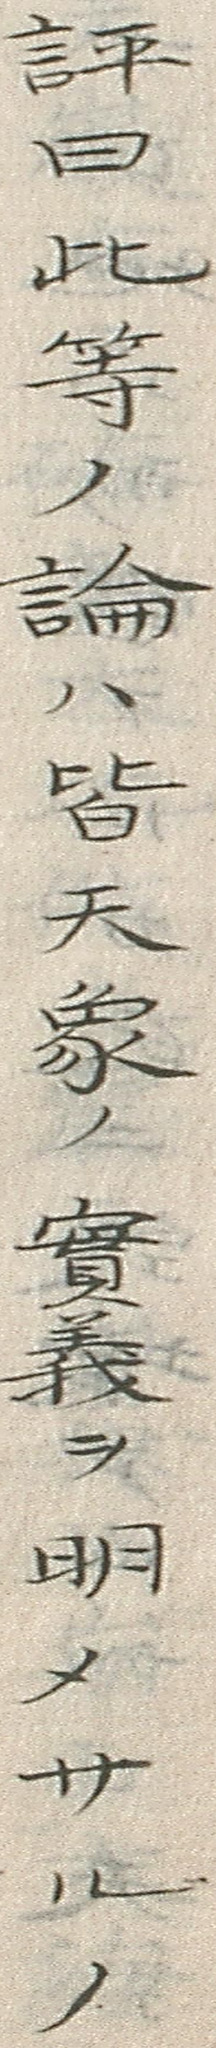評曰此等ノ論ハ皆天象ノ実義ヲ明メサルノ
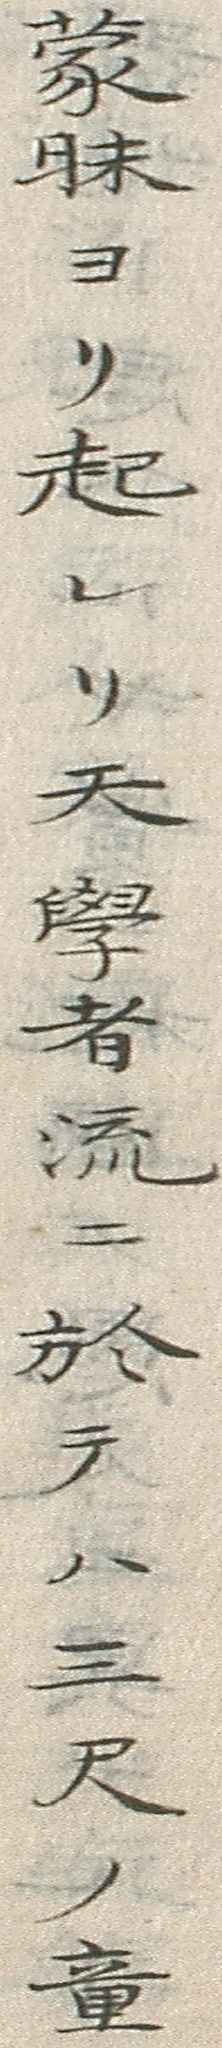蒙昧ヨリ起レリ天学者流ニ於テハ三尺ノ童
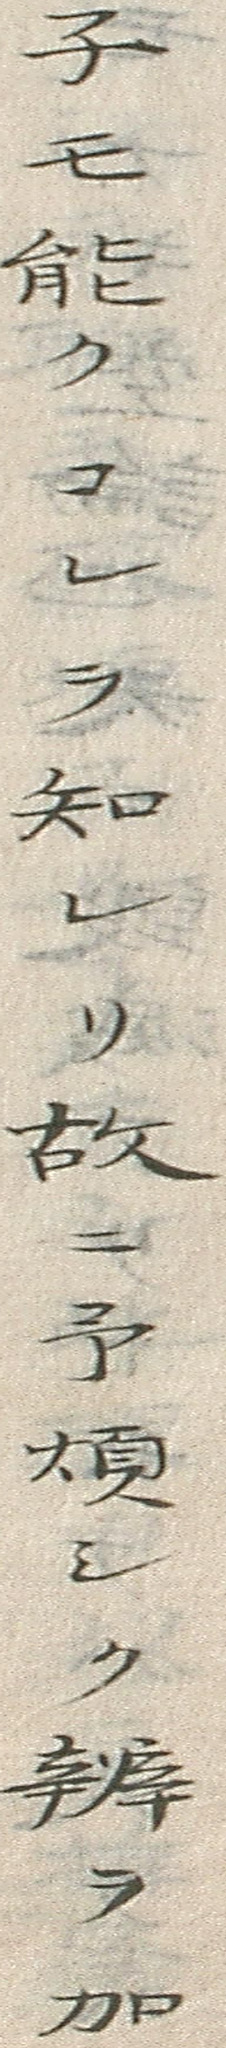子モ能クコレヲ知レリ故ニ予煩シク弁ヲ加
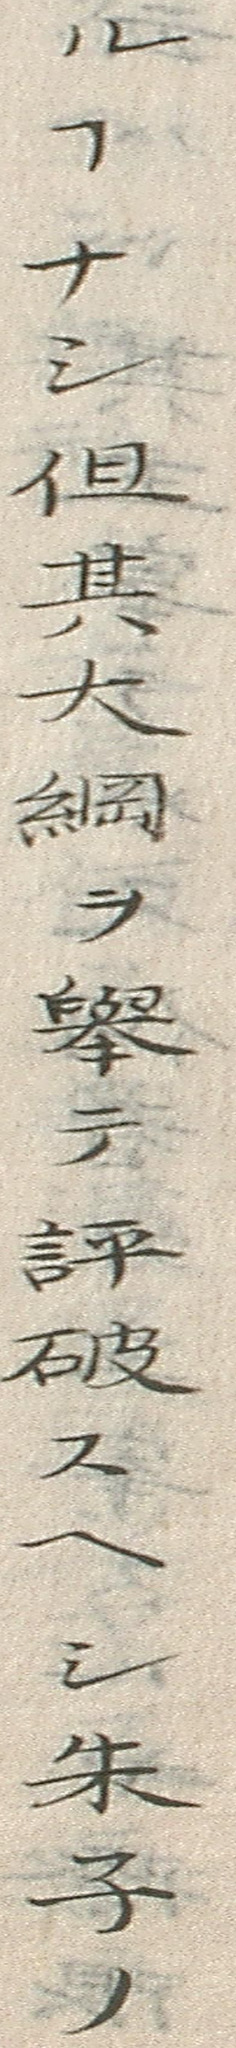ルコトナシ但其大綱ヲ挙テ評破スヘシ朱子ノ
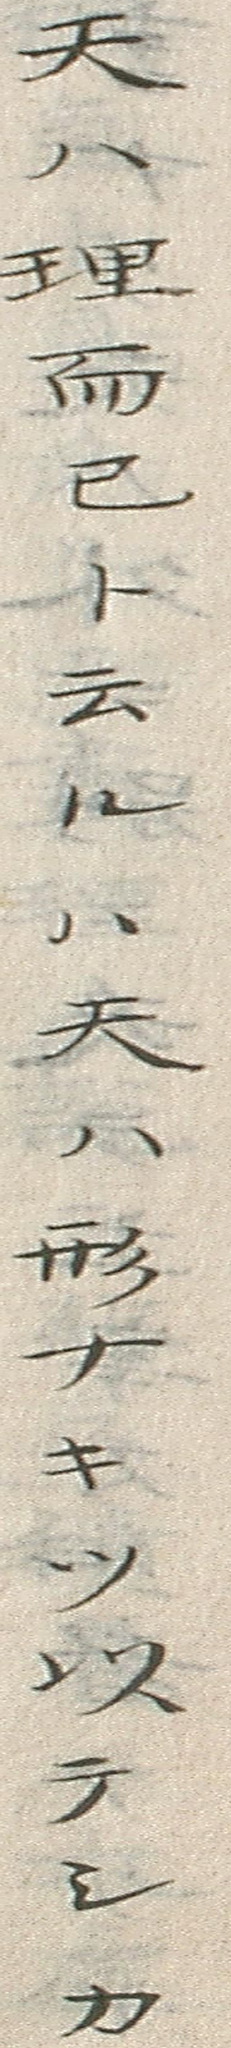天ハ理而已ト云ルハ天ハ形ナキツ以テシカ
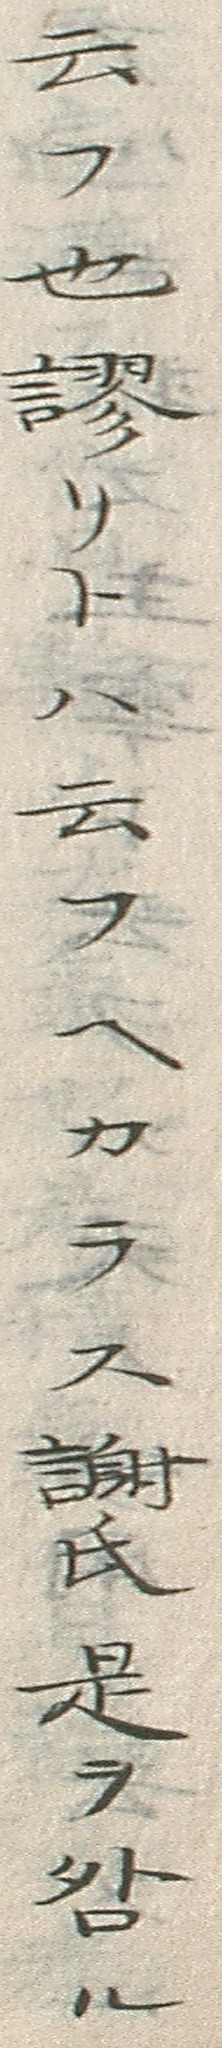云フ也謬リトハ云フヘカラス謝氏是ヲ咎ル
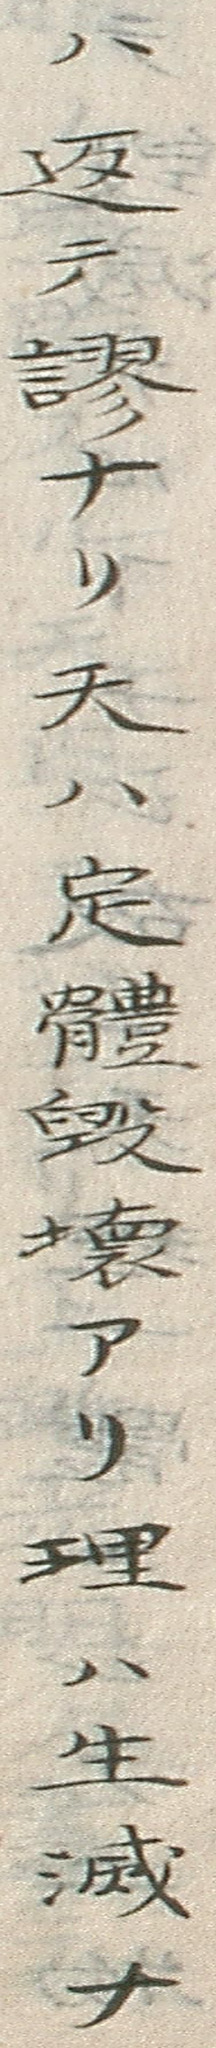ハ返テ謬ナリ天ハ定体毀壊アリ理ハ生滅ナ
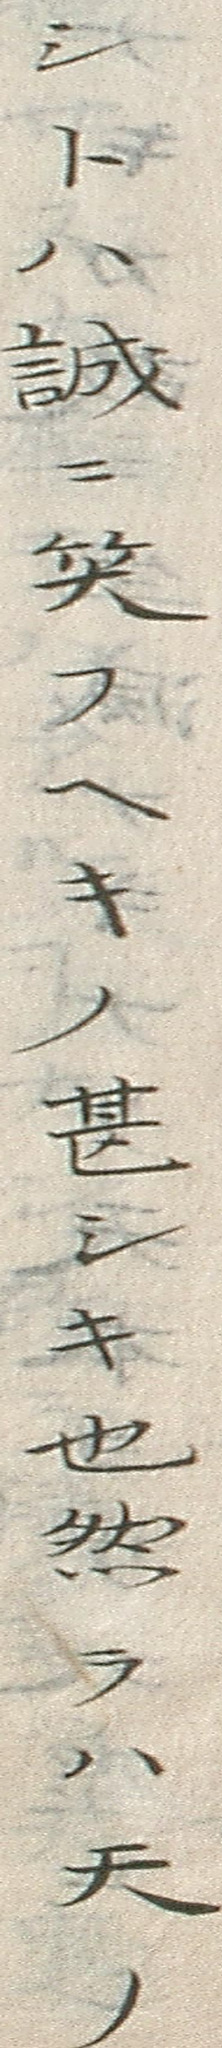シトハ誠ニ笑フヘキノ甚シキ也然ラハ天ノ
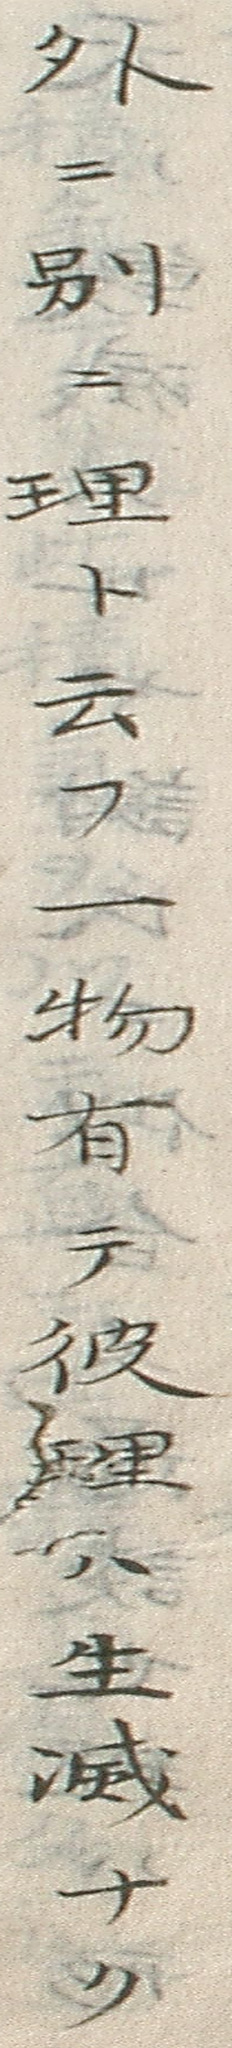外ニ別ニ理ト云フ一物有テ彼理ハ生滅ナリ
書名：天學略名目羽翼　全
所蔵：東京大学地震研究所図書室 Earthquake Research Institute Library, The University of Tokyo, JAPAN
